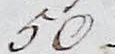50
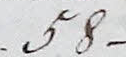58
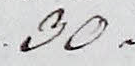30
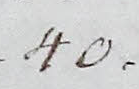40
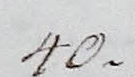40
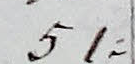51
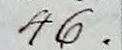46
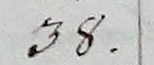38.
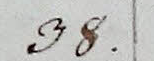38.
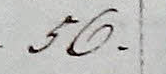56.
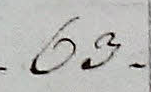63
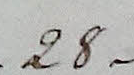28
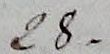28
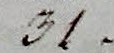31
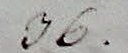36
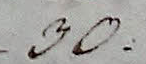30
